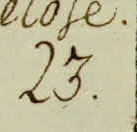23.
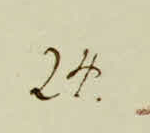24.
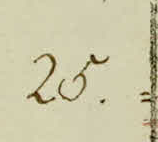25.
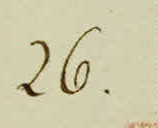26.
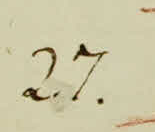27.
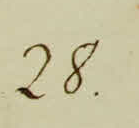28.
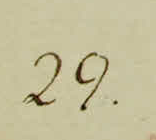29.
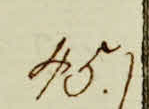45.
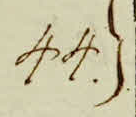44.
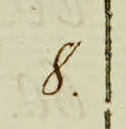8.
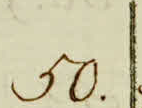50.
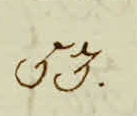53.
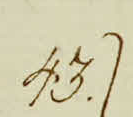43.
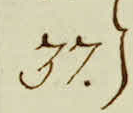37.
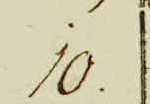10.
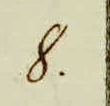8.
